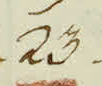23
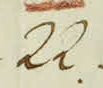22
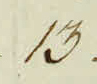13
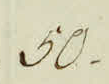50
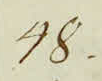48
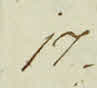17
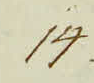14
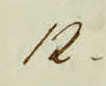12
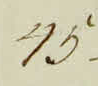45
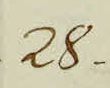28
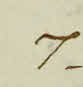7
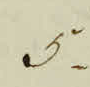5
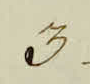3
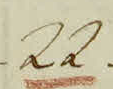22
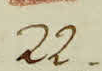22
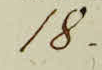18
